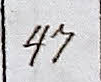47
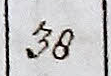38
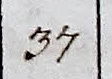37
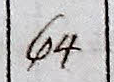64
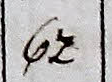62
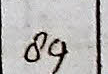89
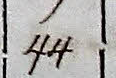44
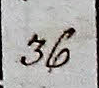36
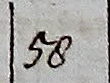58
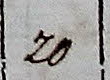20
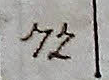72
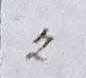2
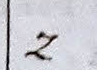2
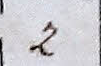2
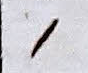1
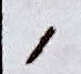1
